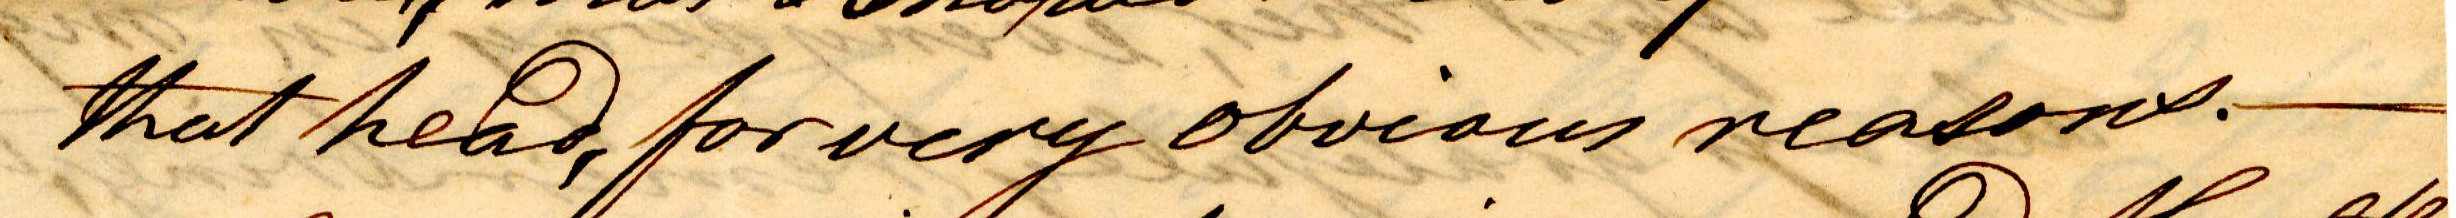that head, for very obvious reasons.-
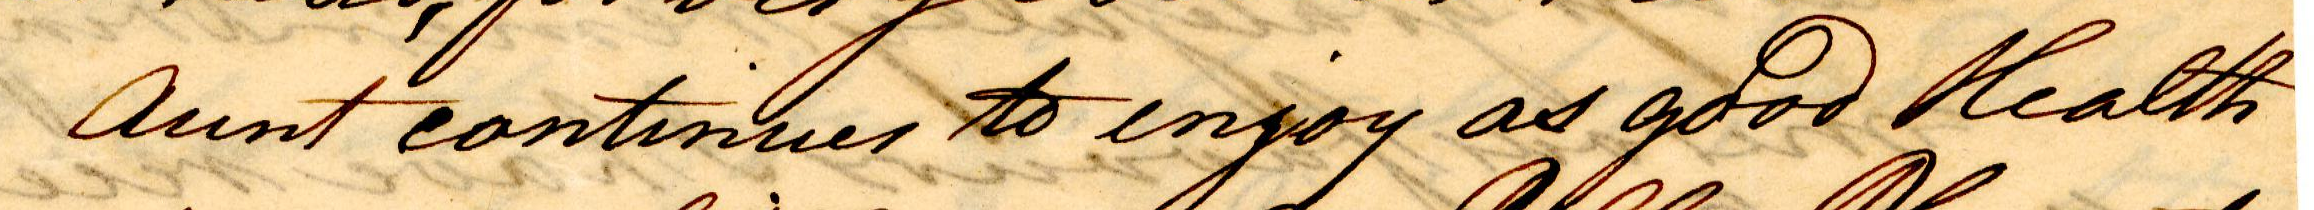Aunt continues to enjoy as good Health
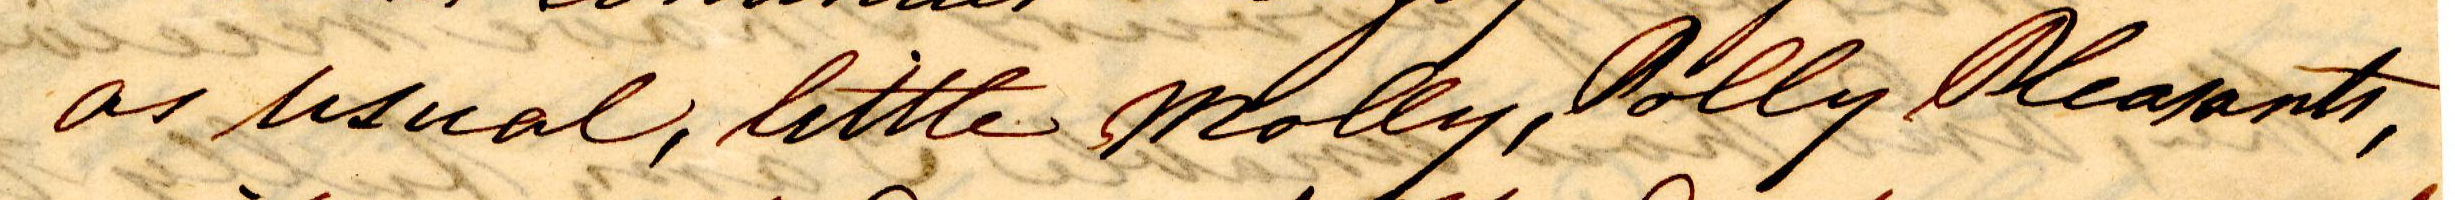as usual, little Molly, Polly Pleasants,
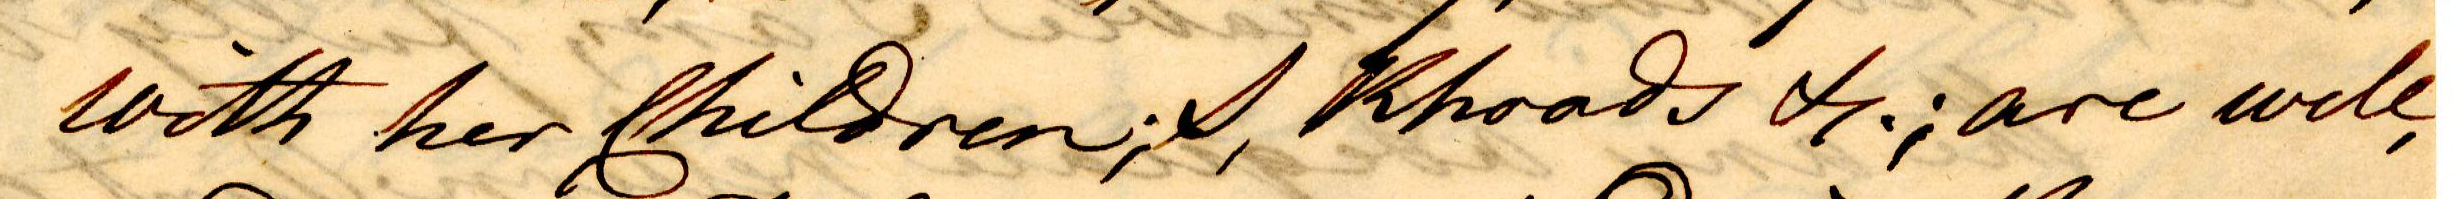with her Children; S. Rhoads &c; are well,
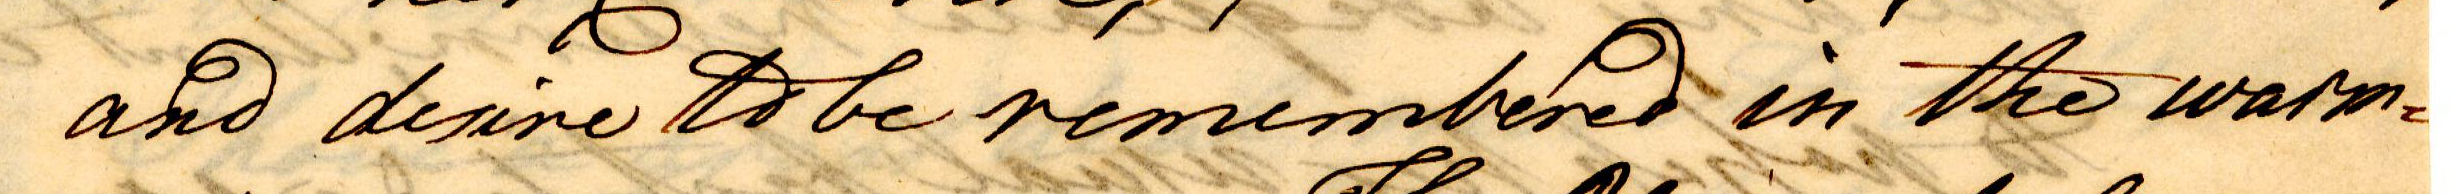and desire to be remembered in the warm-
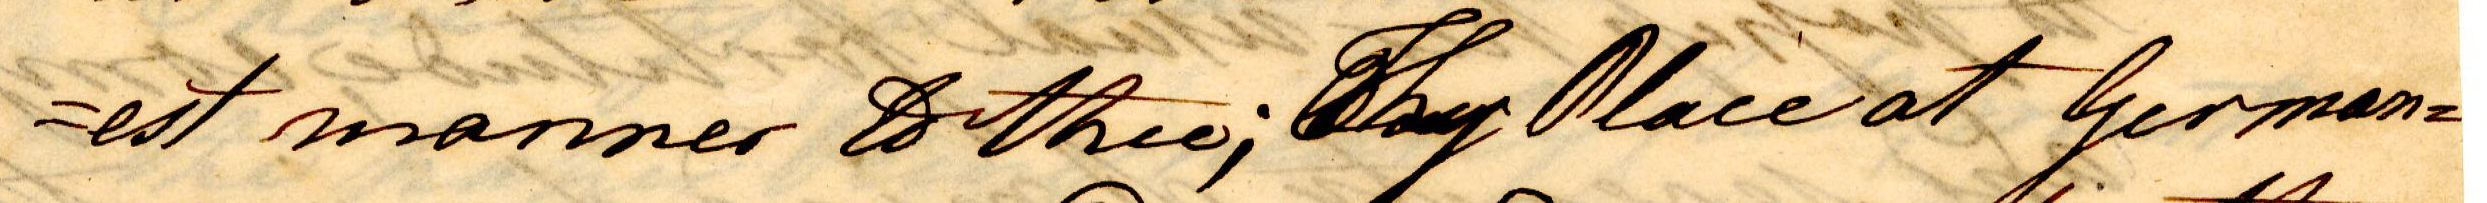-est manner to thee; Thy Place at German-
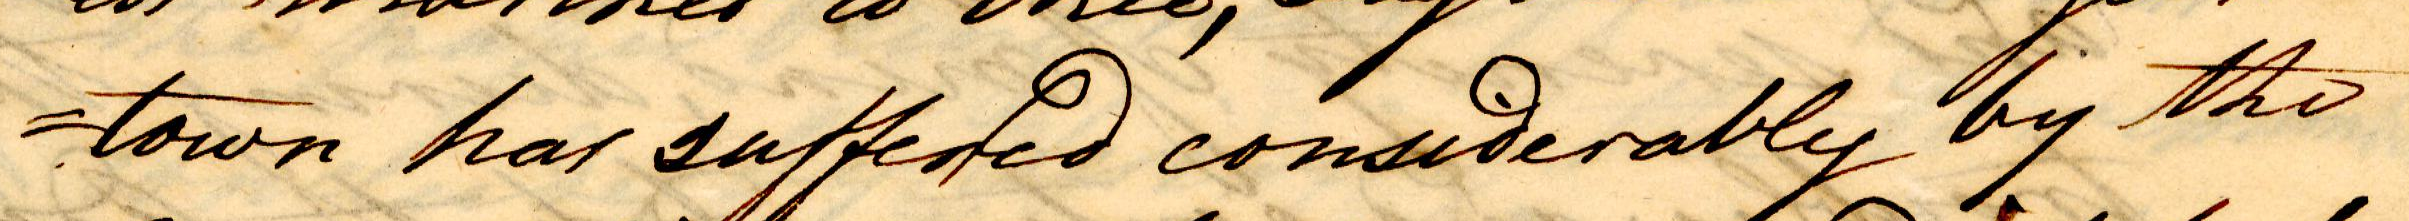-town has suffered considerably by the
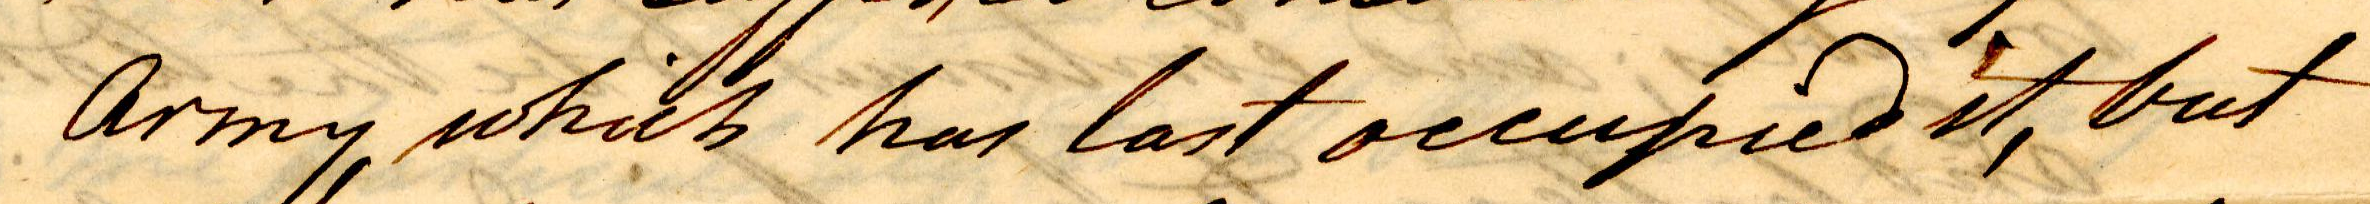Army, which has last occupied it, but
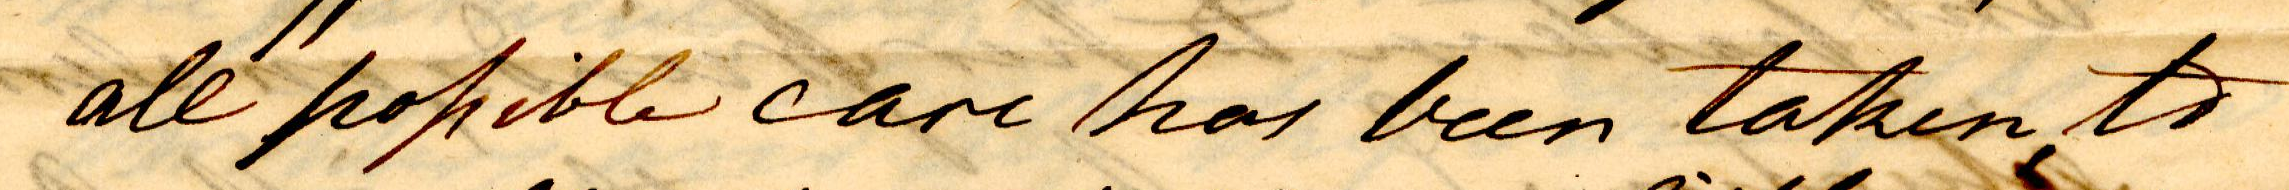all possible care has been taken to
